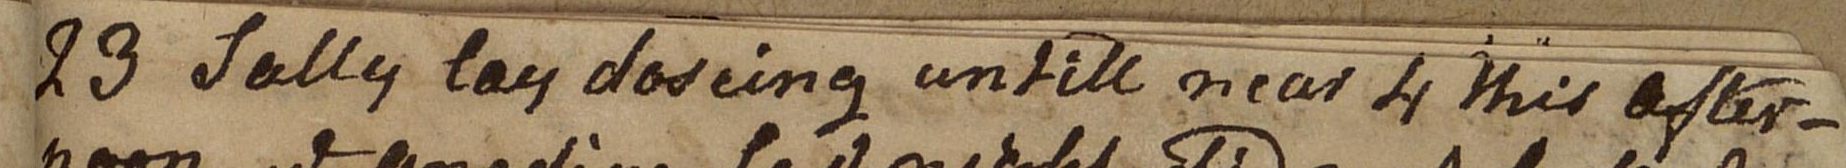23 Sally lay doseing untill near 4 this after-
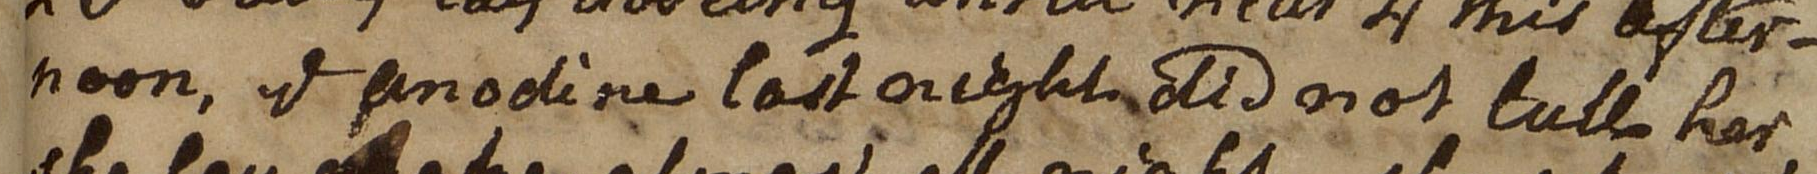noon, y^e Anodine last night did not lull her,
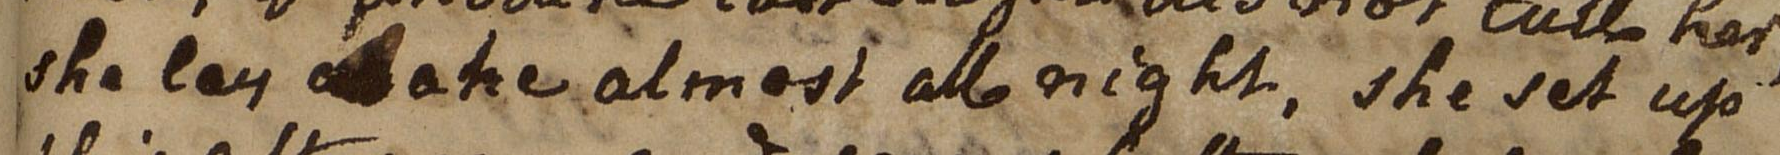she lay awake almost all night, she set up
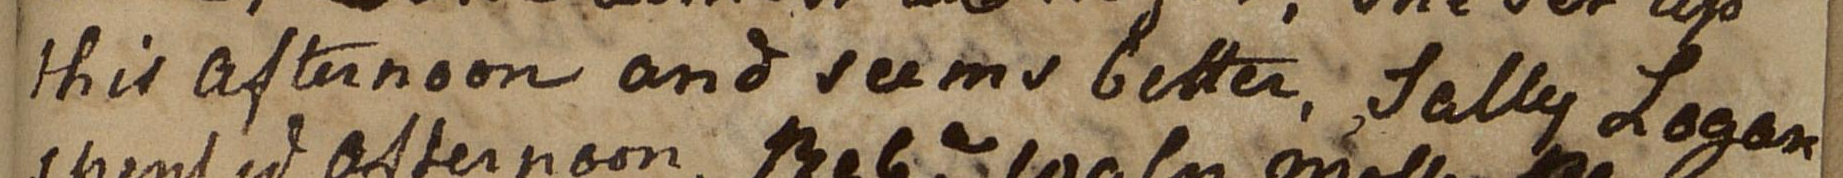this afternoon and seems better, Sally Logan
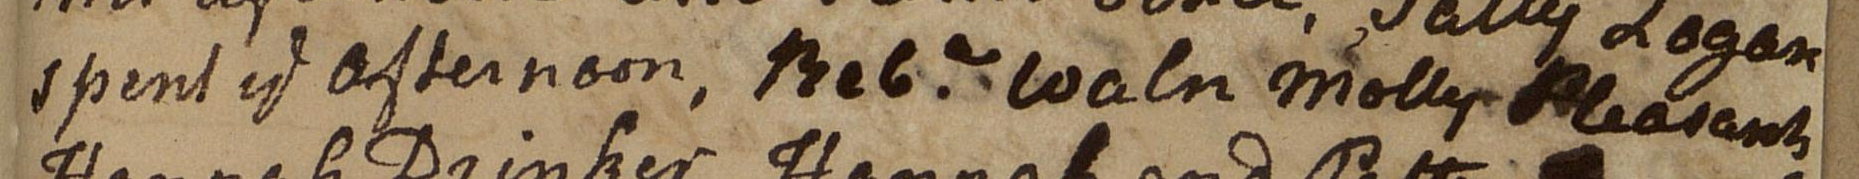spent y^e afternoon, Reb^a Waln Molly Pleasants
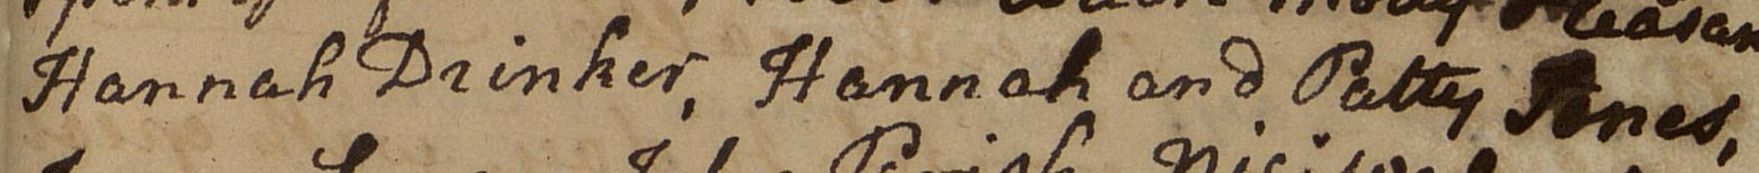Hannah Drinker, Hannah and Patty Pines
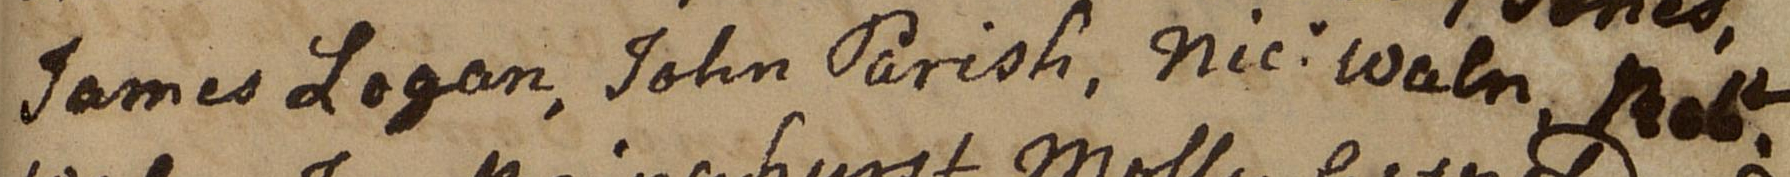James Logan, Jahn Parish, Nic.^s Waln, Rob.^t
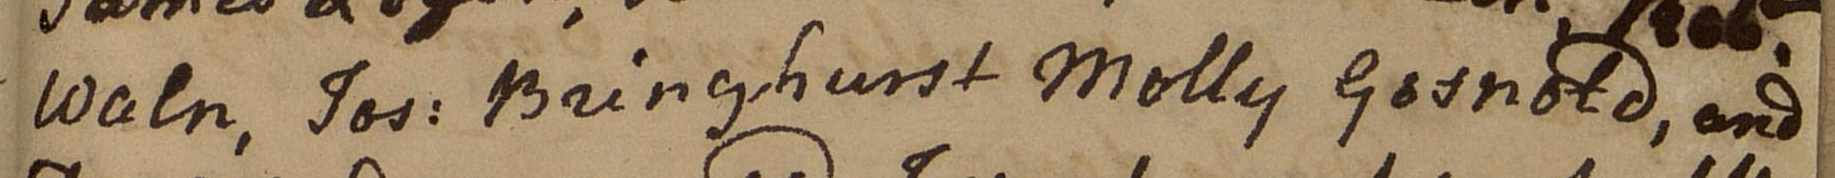Waln, Jos: Bringhurst Molly Gosnold, and
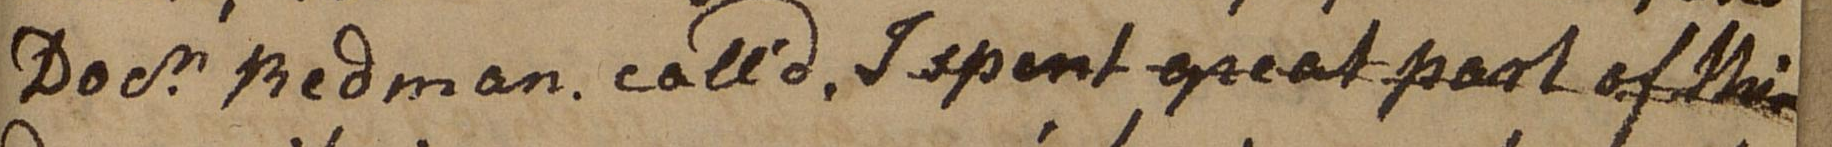Doc^r. Redman. call'd, I spent great part of this
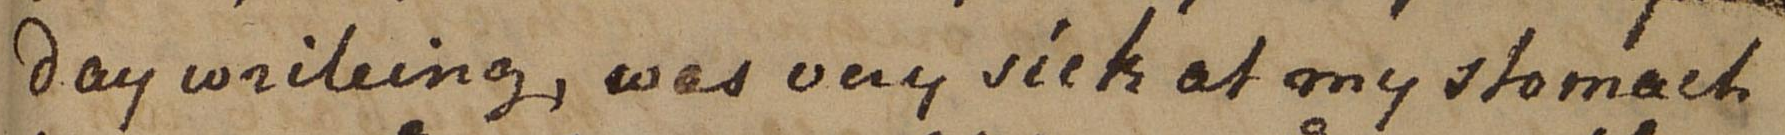day writeing, was very sick at my stomach
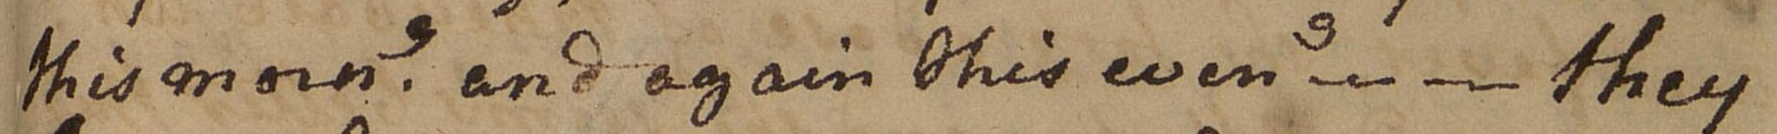this morn.^g and again this even^g-- they
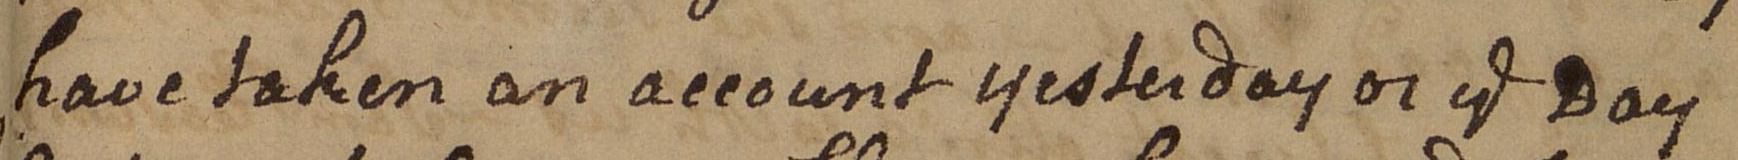have taken an account yesterday or y^e Day
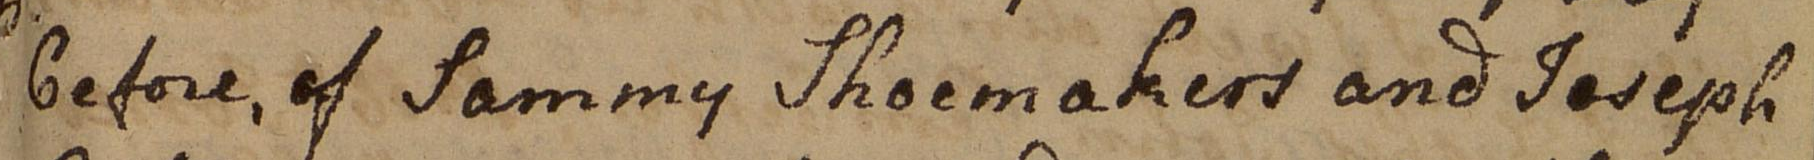before of Sammy Shoemakers and Joseph
